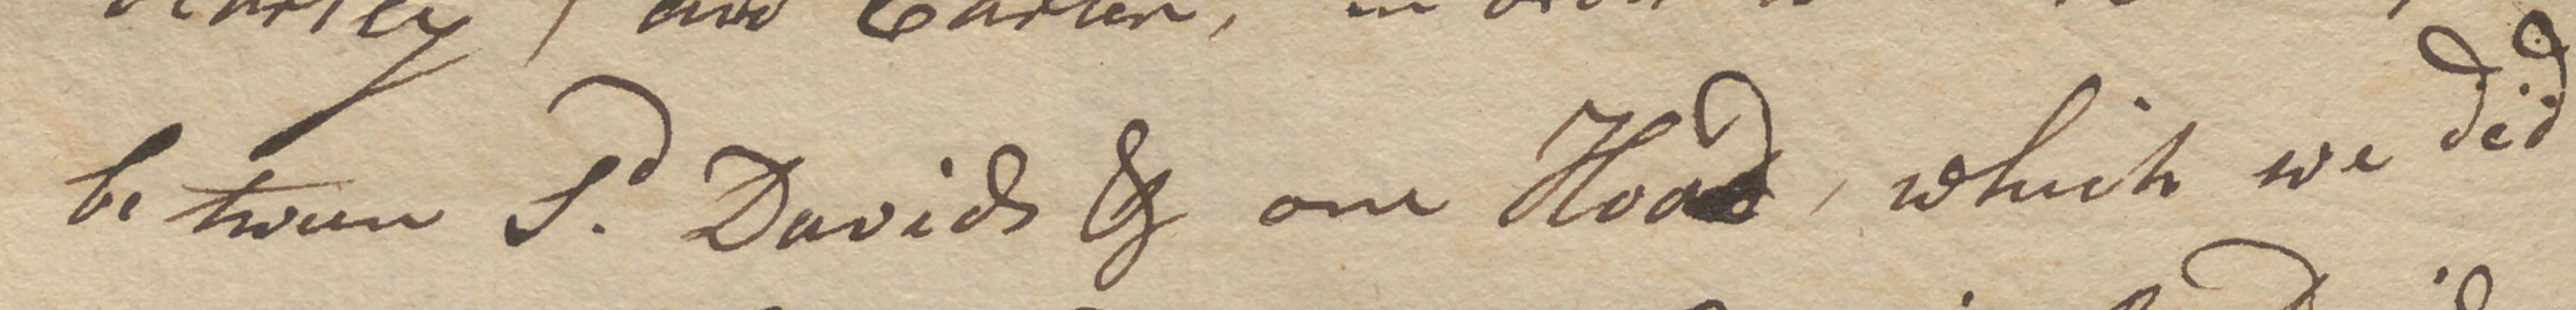between s^d. Davids & one Hoad, which we did
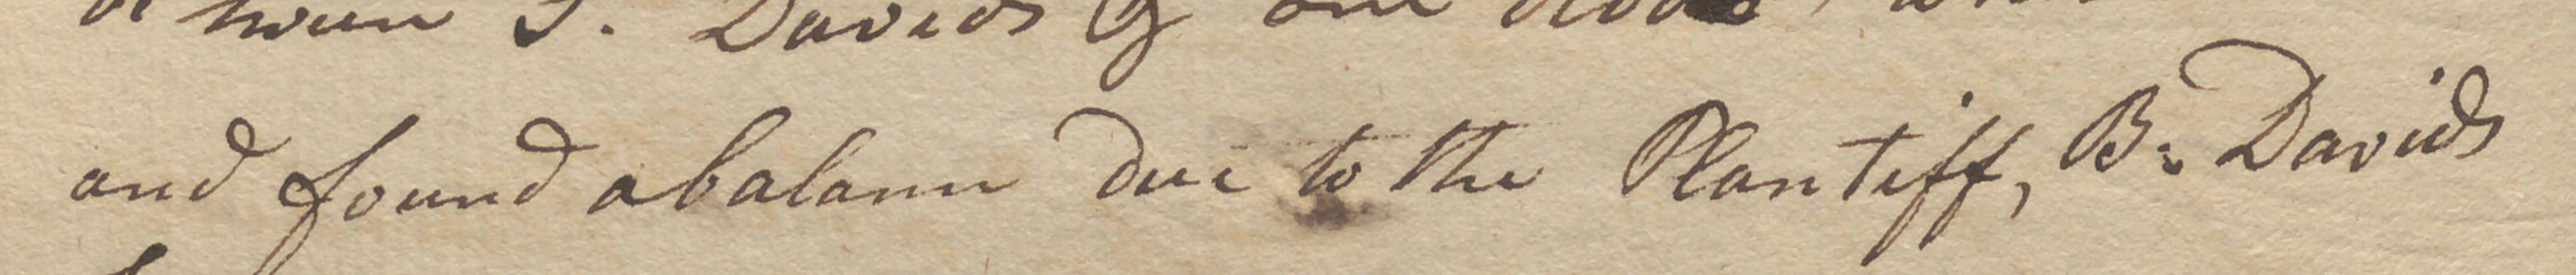and found a balance due to the Plantiff, B. Davids
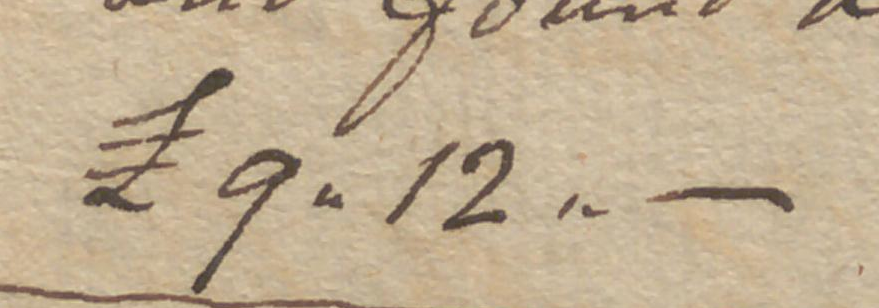£9.12..-
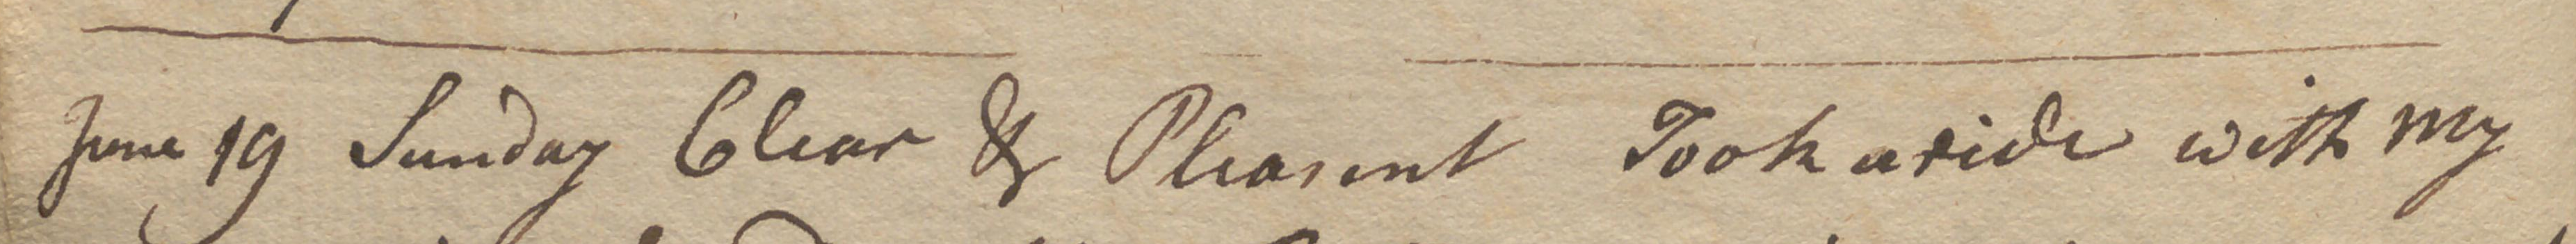June 19 Sunday Clear & Pleasent Took a ride with my
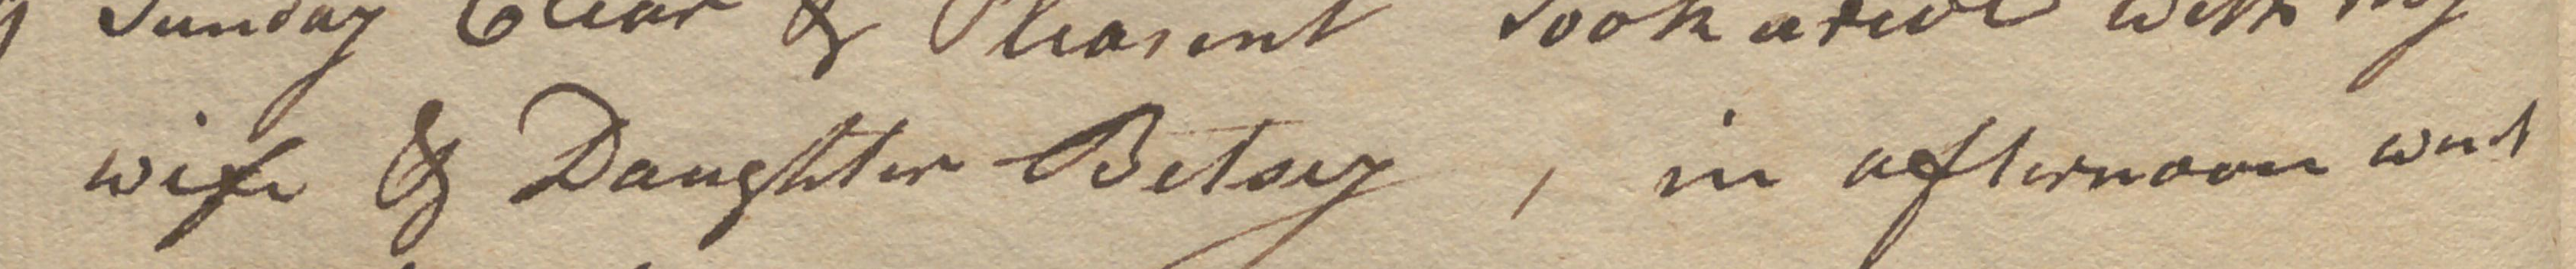wife & Daughter Betsey, in afternoon went
